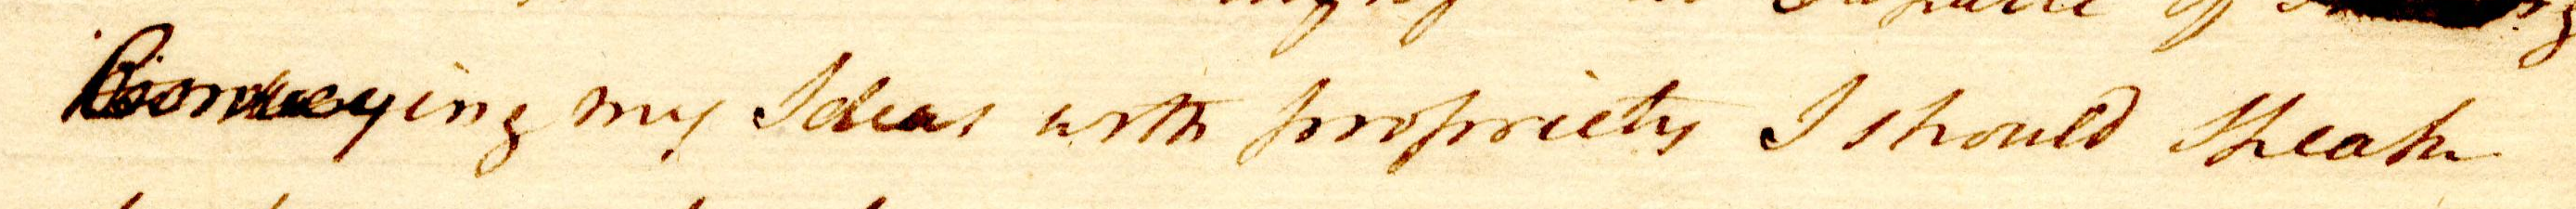Conveying my Ideas with propriety I should speak
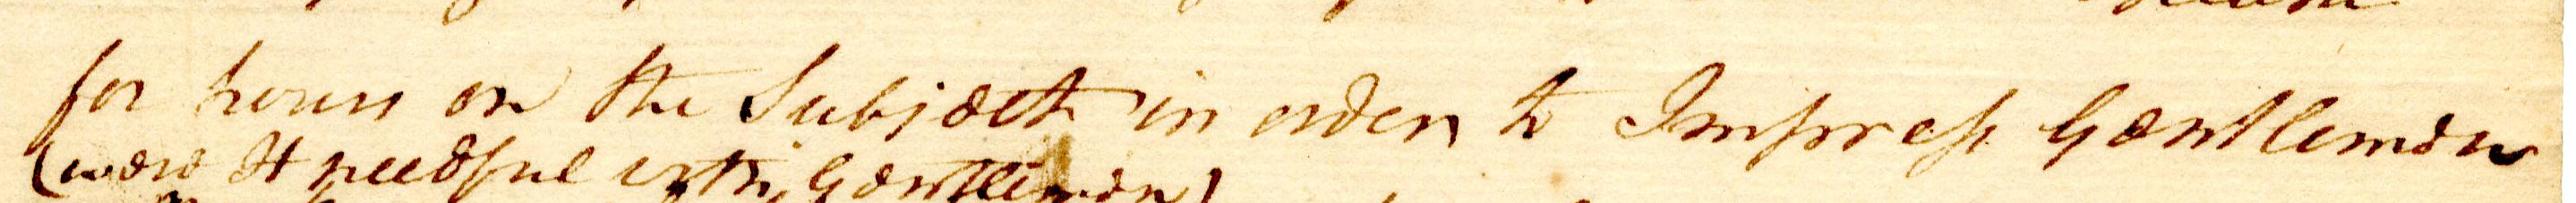for hours on the Subject in order to Impress Gentleman
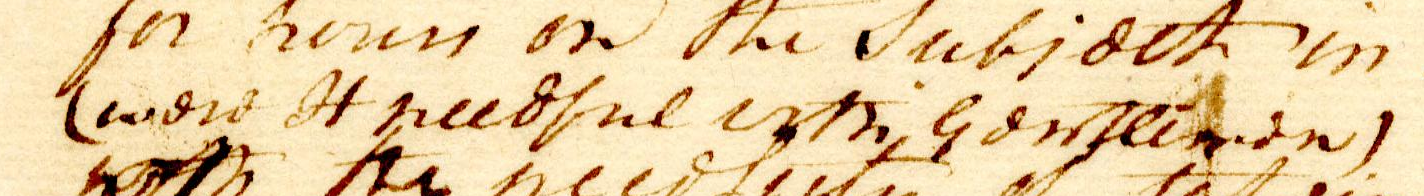(want it needful with Gentlemen)
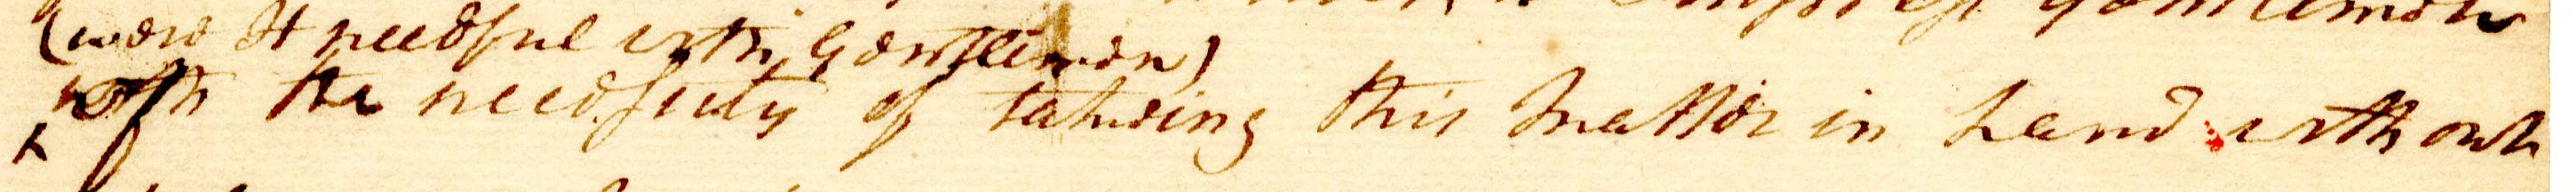with the necessary of takeing this matter in hand with out
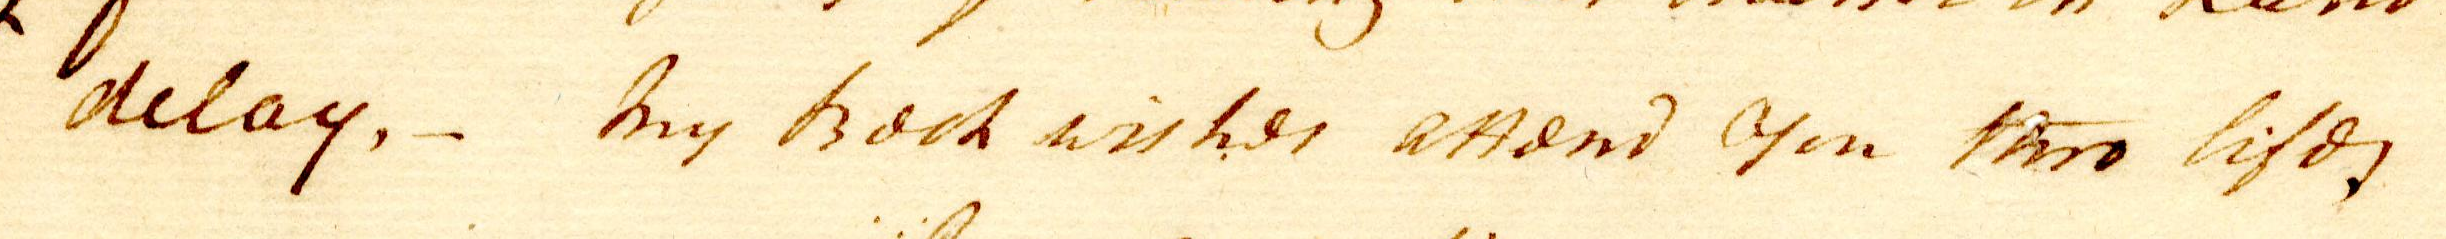delay.- my Best wishes attend you thro life.
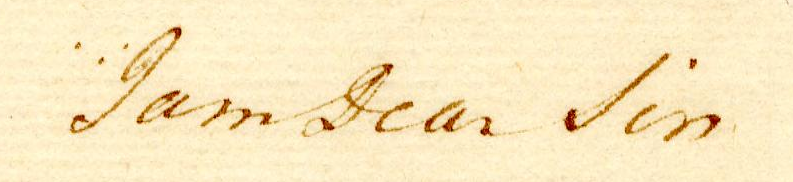I am Dear Sir
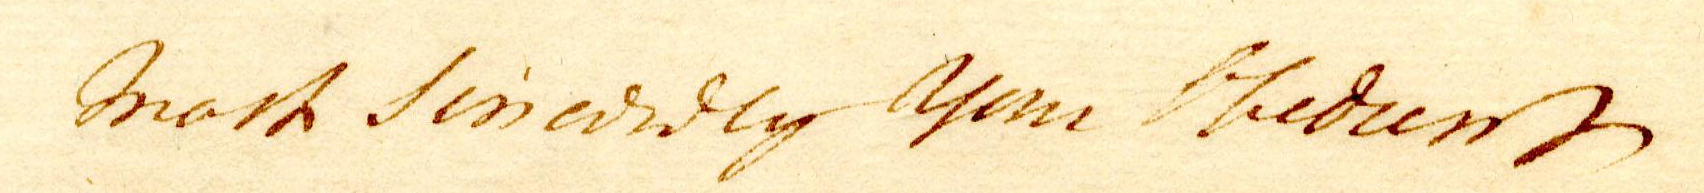Most Sincerely Your Obedient
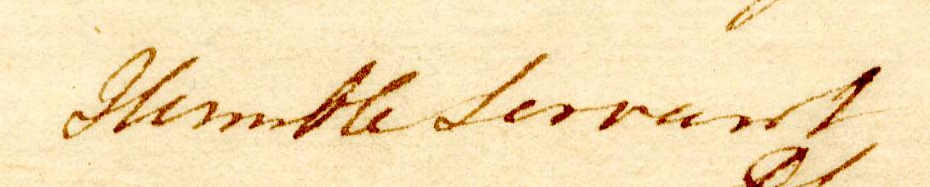Humble servant
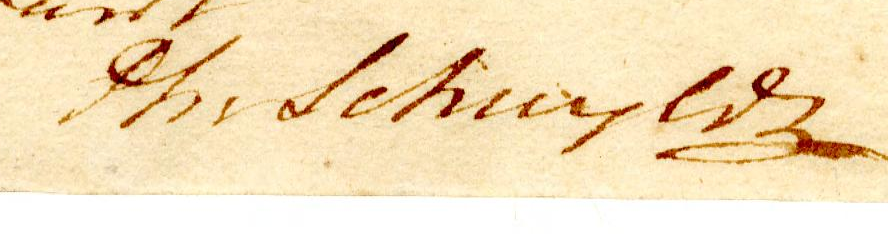Phi Schuyler
